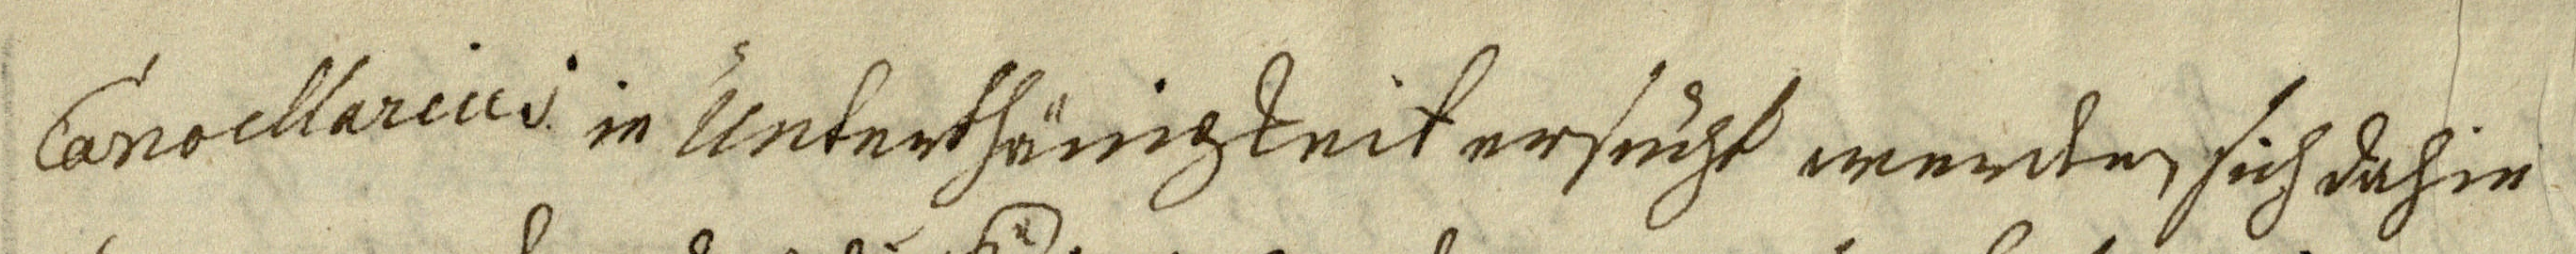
Cancellarius in Unterthänigkeit ersucht werden, sich dahin
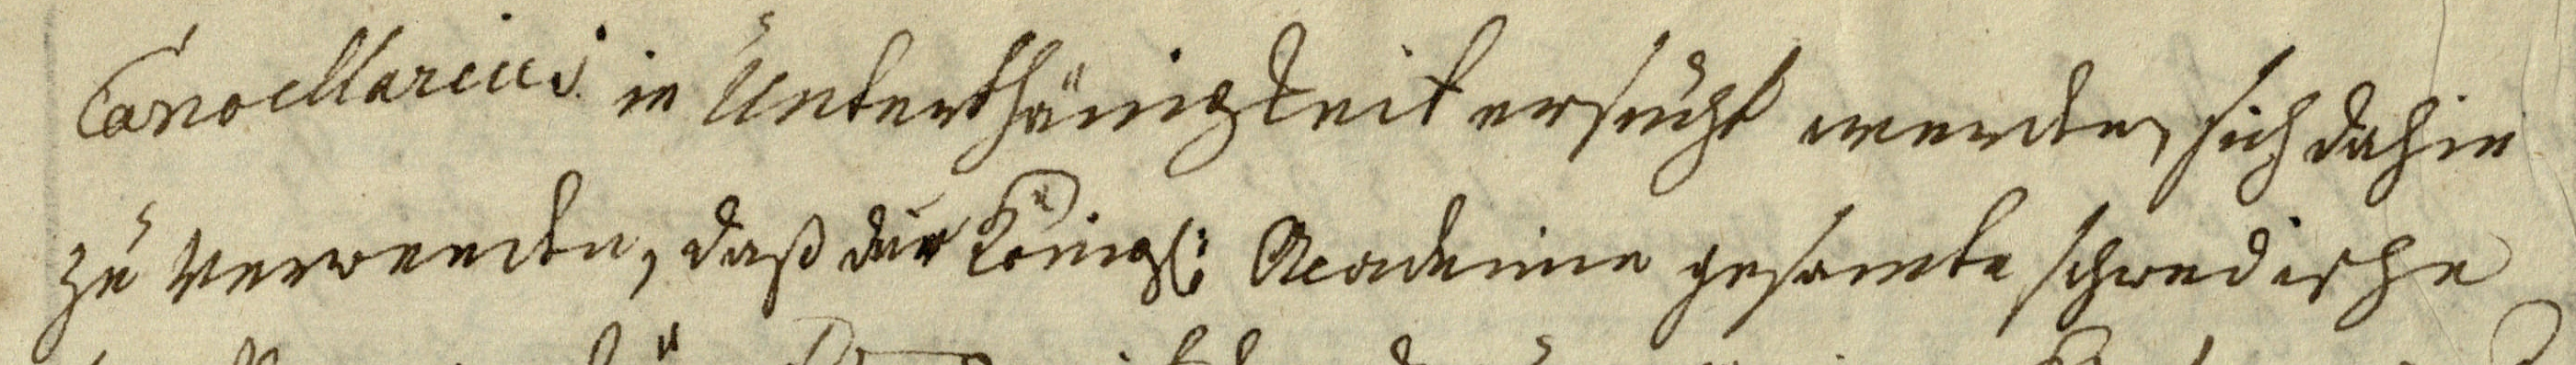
zu verwenden, daß der Königl. Academie gesamte schwedische
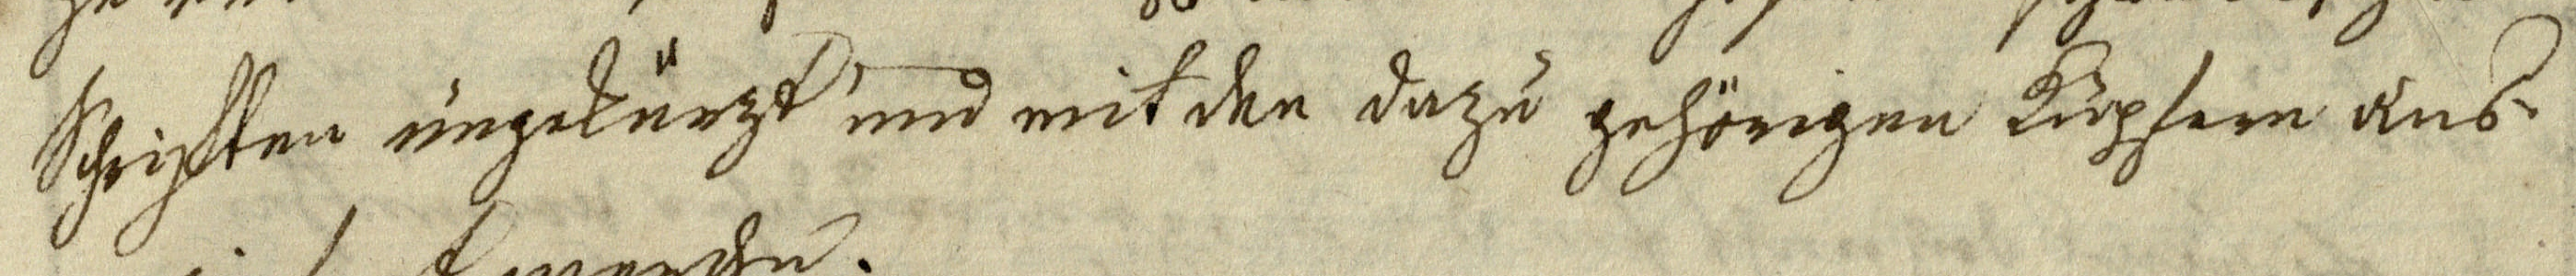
Schriften ungekürzt und mit den dazu gehörigen Kupfern aus¬
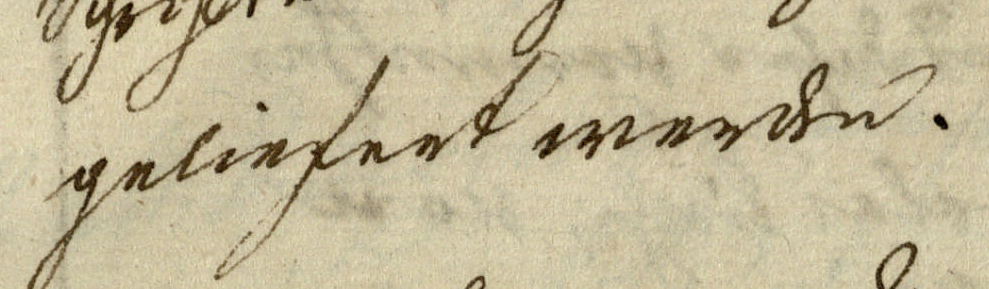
geliefert werden.
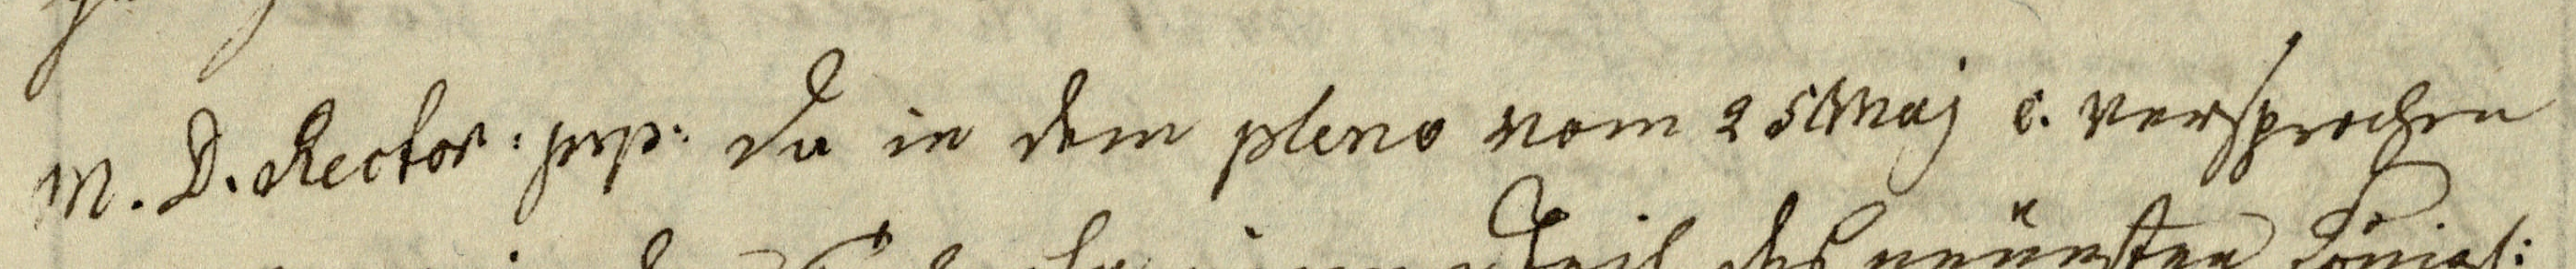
M. D. Rector. pp. Da in dem pleno vom 25. Maj e. Versprochen
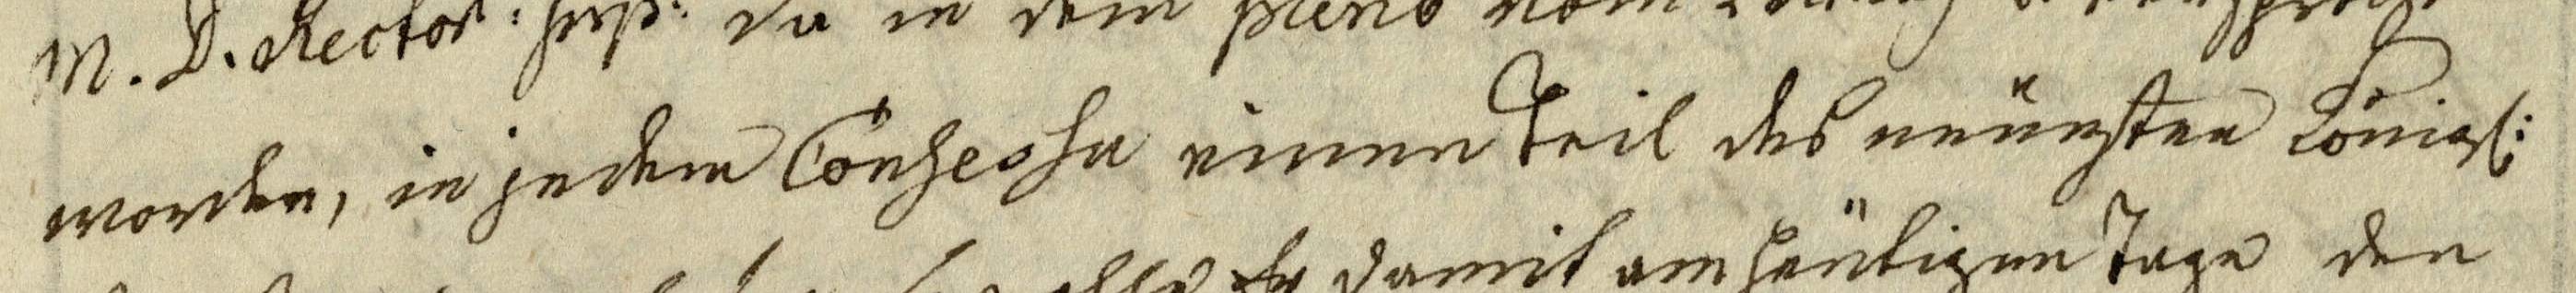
worden, in jedem Consessu einen Teil des neuesten Königl.
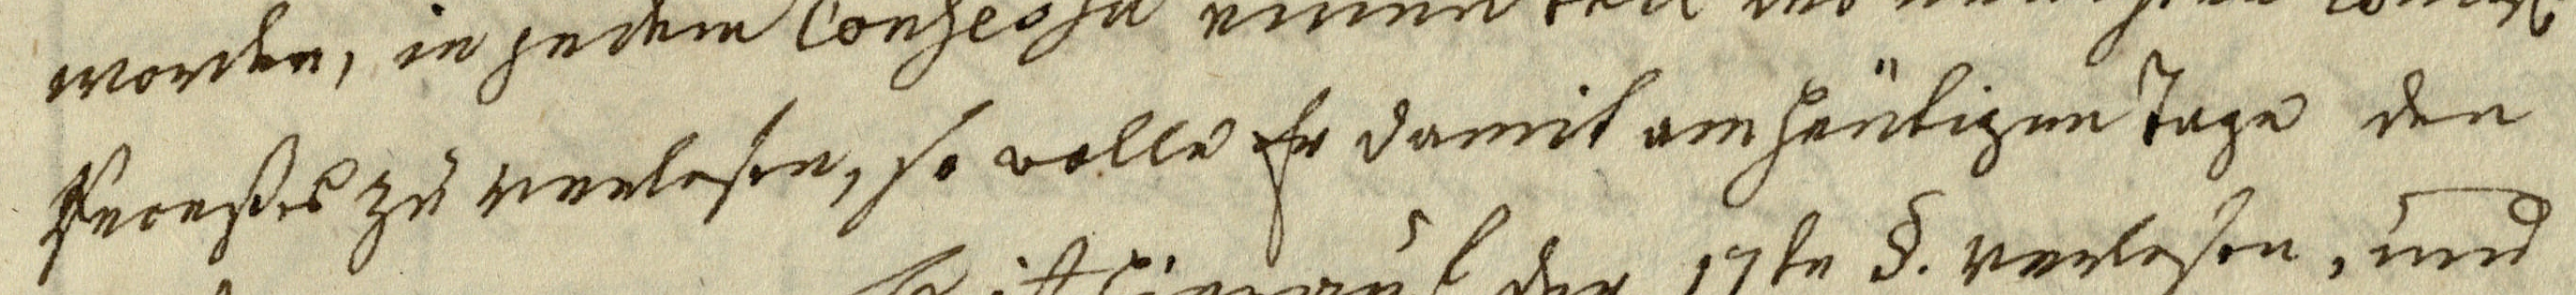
Receßes zu verlesen, so wolle Er damit am heutigen Tage den
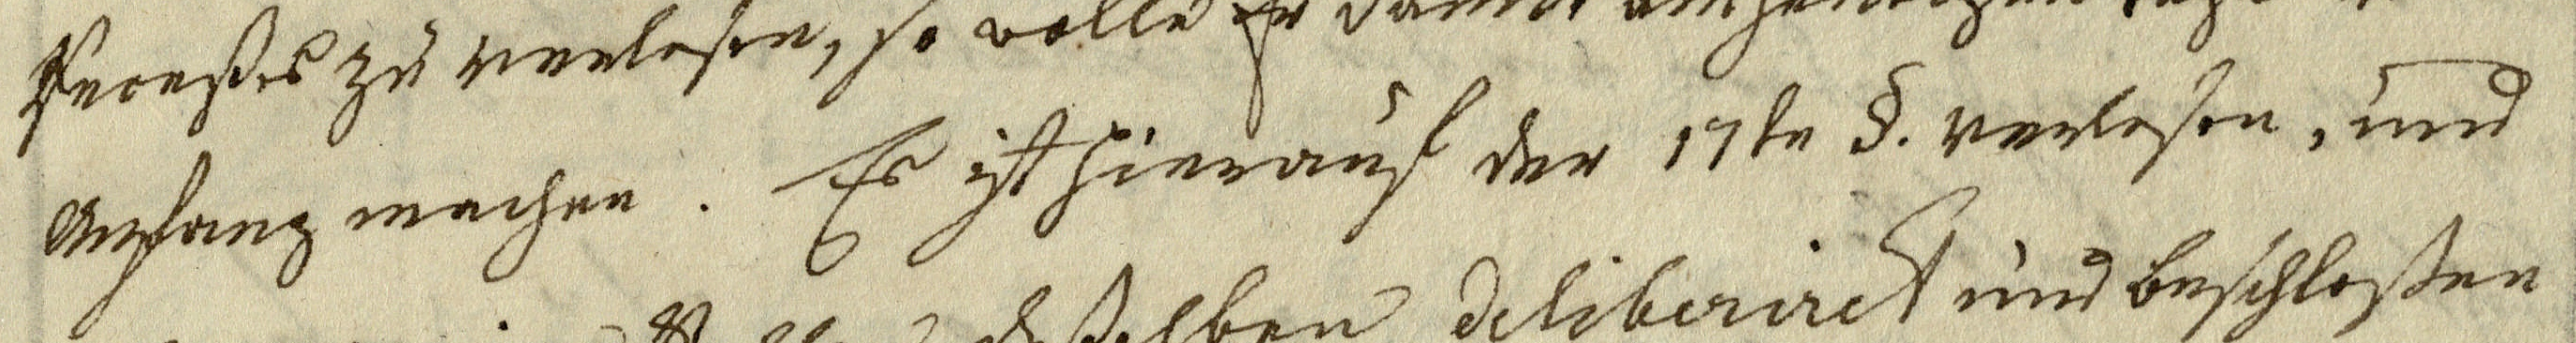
Anfang machen. Es ist hierauf der 17te § verlesen, und
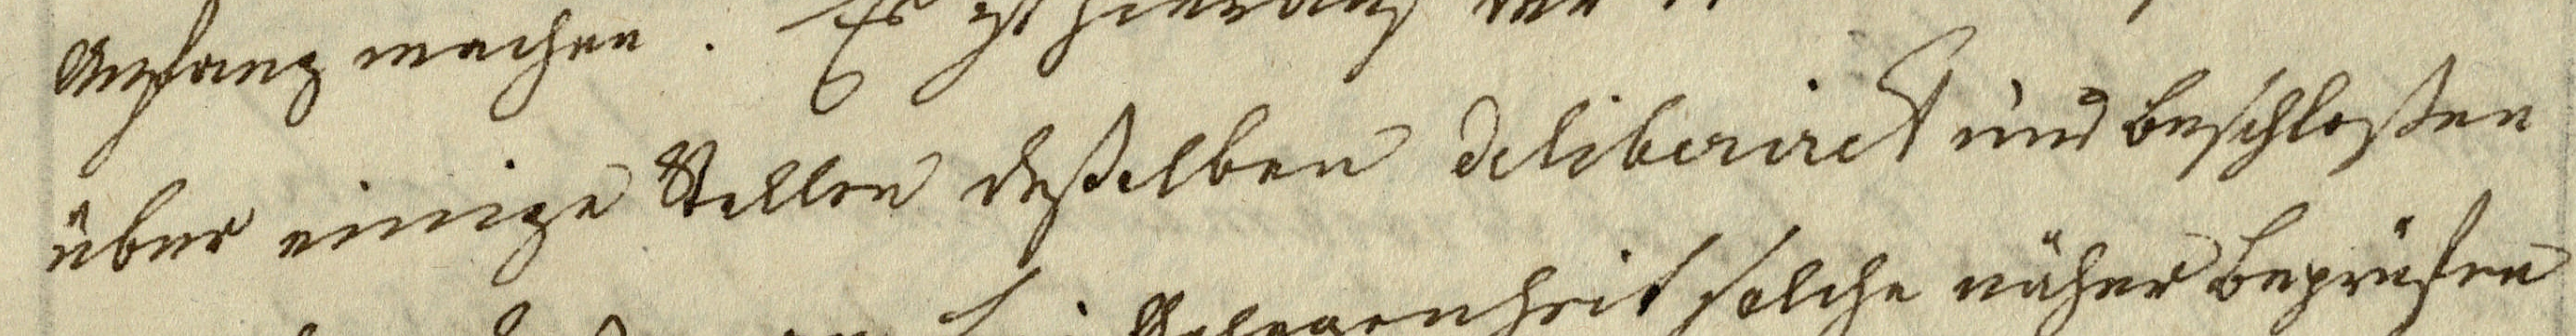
über einigeStellen deßelben deliberiret und beschloßen
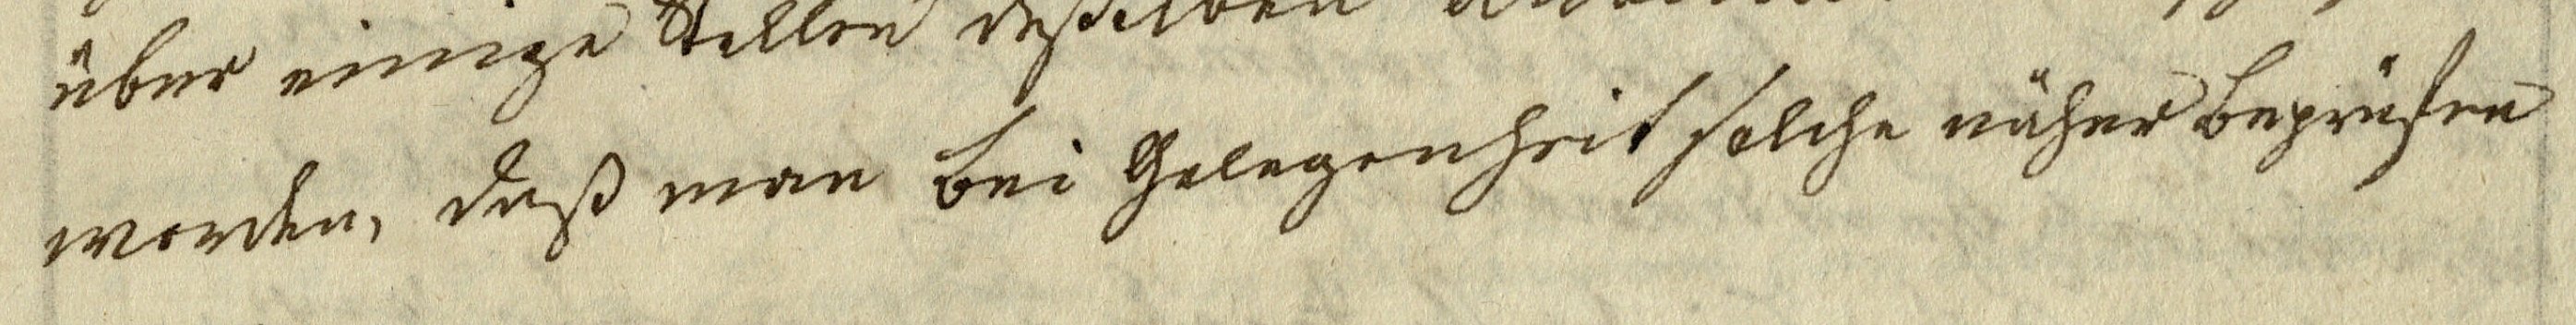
worden, daß man bei Gelegenheit solche näher beprüfen
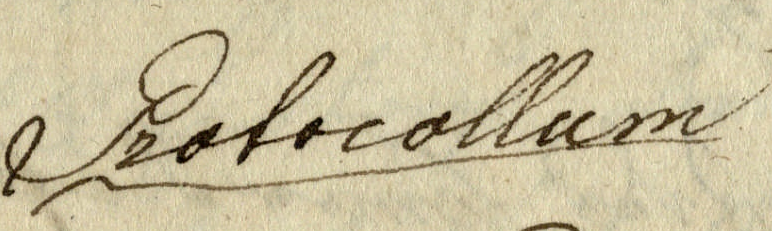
Protocollum
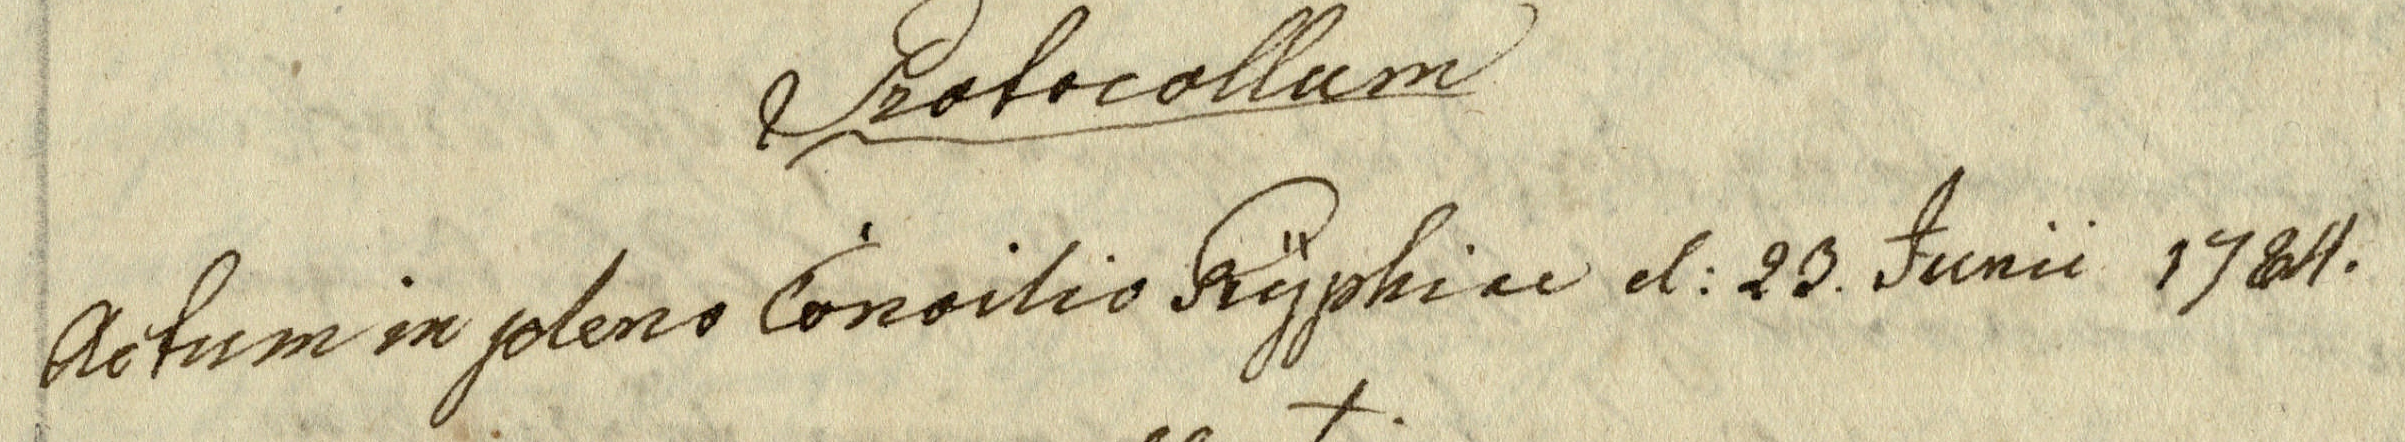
Actum in pleno Concilio Grÿphiae d. 23. Junii 1784
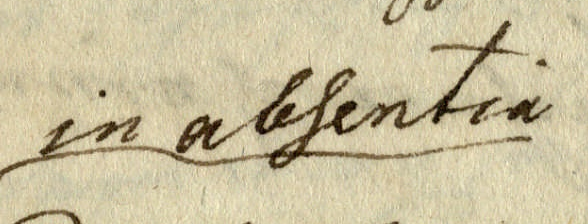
in absentia
